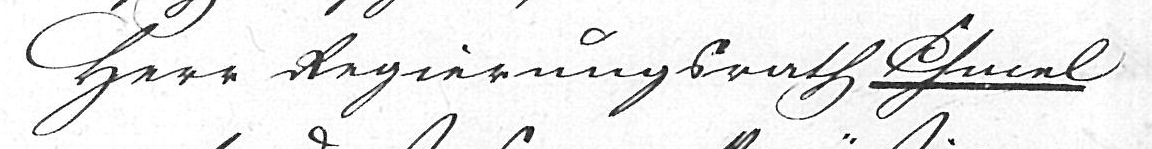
Herr Regierungsrath Chmel
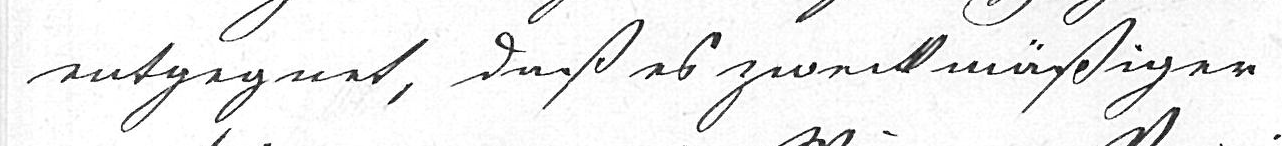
entgegnet, daß es zweckmäßiger
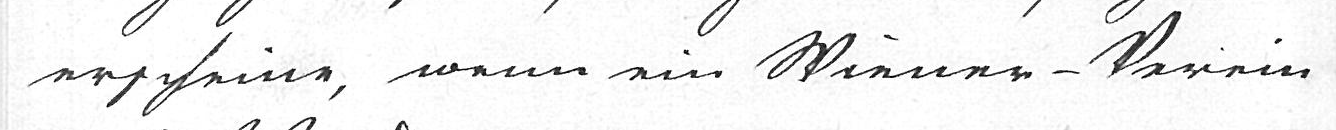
erscheine, wenn ein Wiener Verein
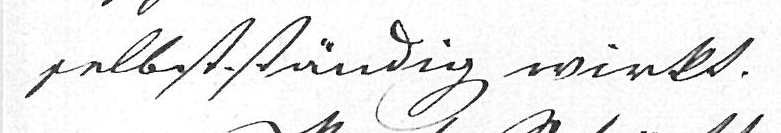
selbstständig wirkt.
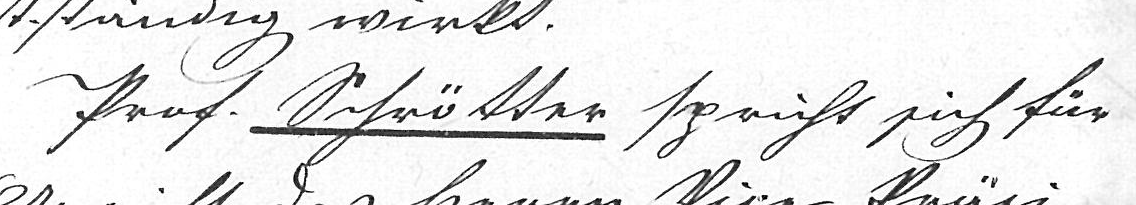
Prof. Schrötter spricht sich für
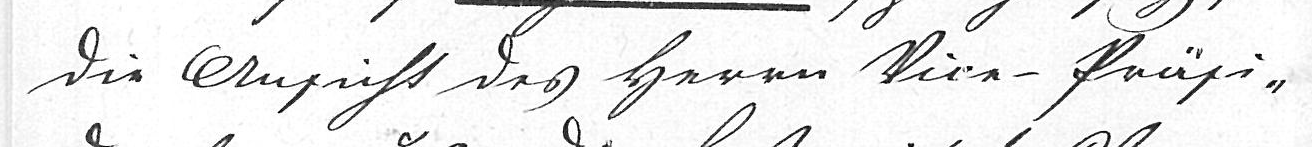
die Ansicht des Herrn Vice-Präsi-
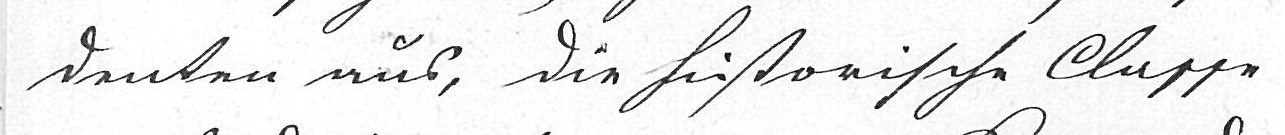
denten aus, die historische Classe
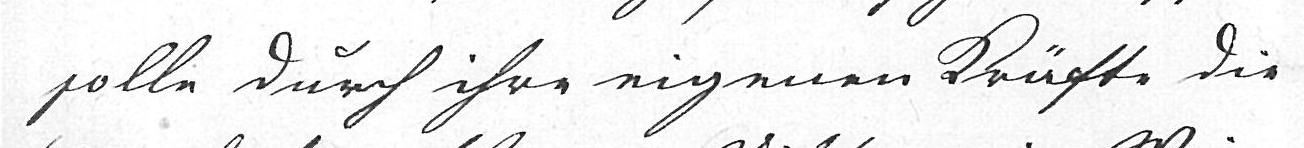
solle durch ihre eigenen Kräfte die
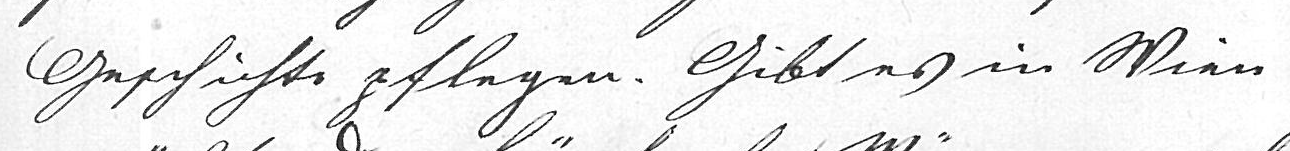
Geschichte pflegen. Gibt es in Wien
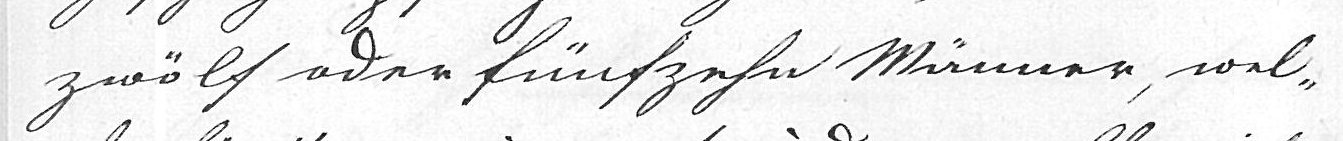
zwölf oder fünfzehn Männer, wel-
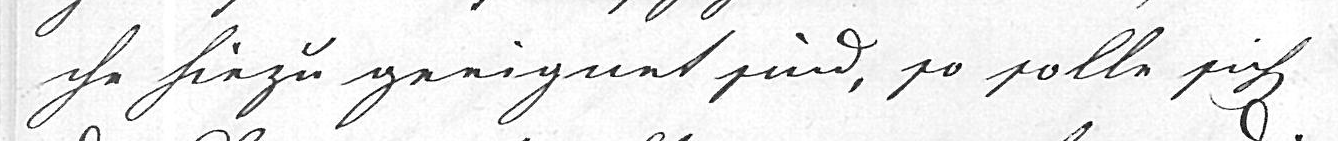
che hiezu geeignet sind, so solle sich
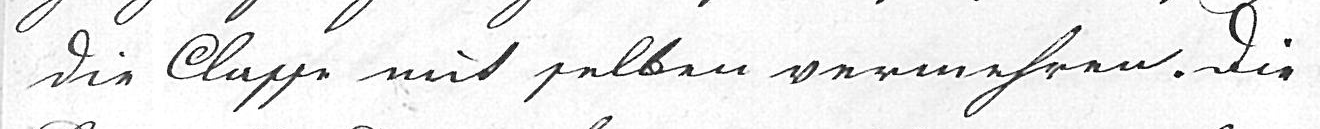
die Classe mit selben vermehren. Die
